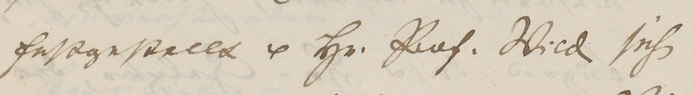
festgestellt & Hr. Prof. Wild sich
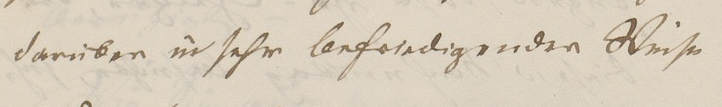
darüber in sehr befriedigenden Weise
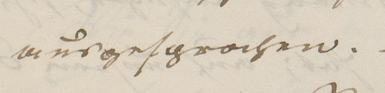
ausgesprochen. –
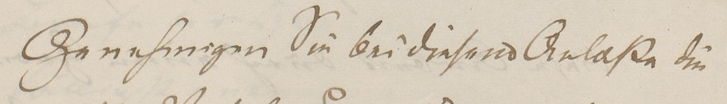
Genehmigen Sie bei diesem Anlaße die
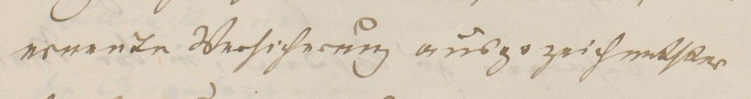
erneute Versicherung ausgezeichnetster
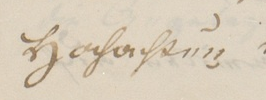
Hochachtung
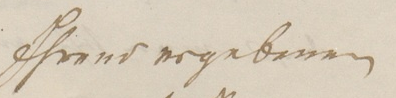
Ihrem ergebenen
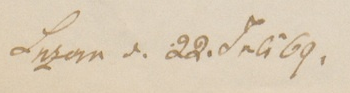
Luzern d. 22. Juli 69.
